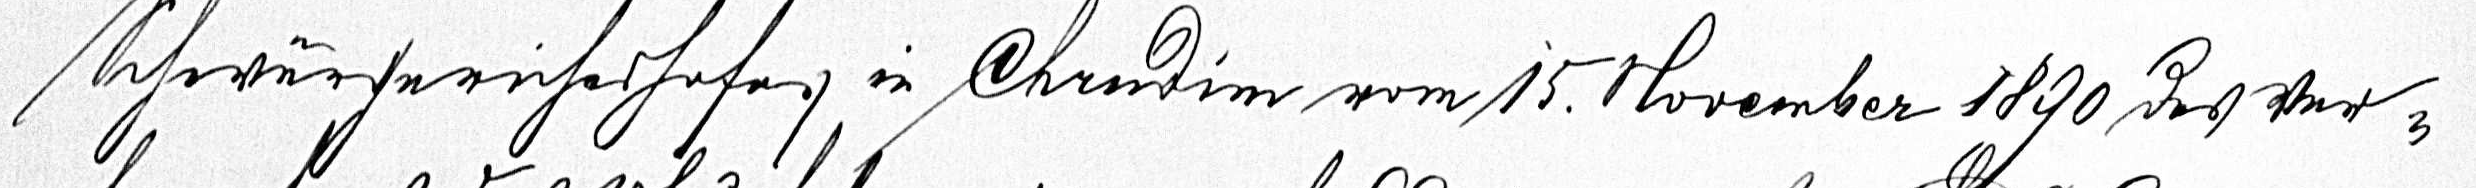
Schwurgerichtshofes in Chredim vom 15. November 1890 des Ver¬
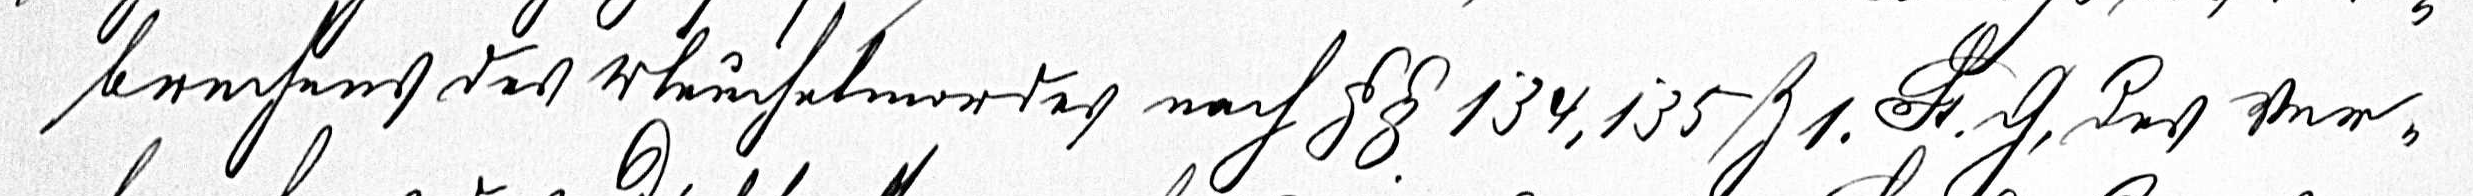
brechens des Meuchelmordes nach §§ 134, 135 Z 1 St G des Ver¬
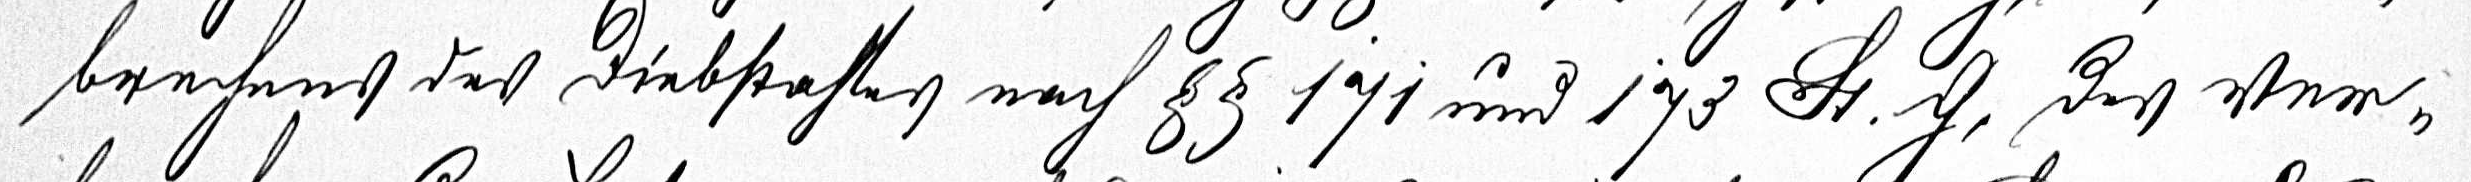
brechens des Diebstahles nach §§ 171 und 173 St. G. des Ver¬
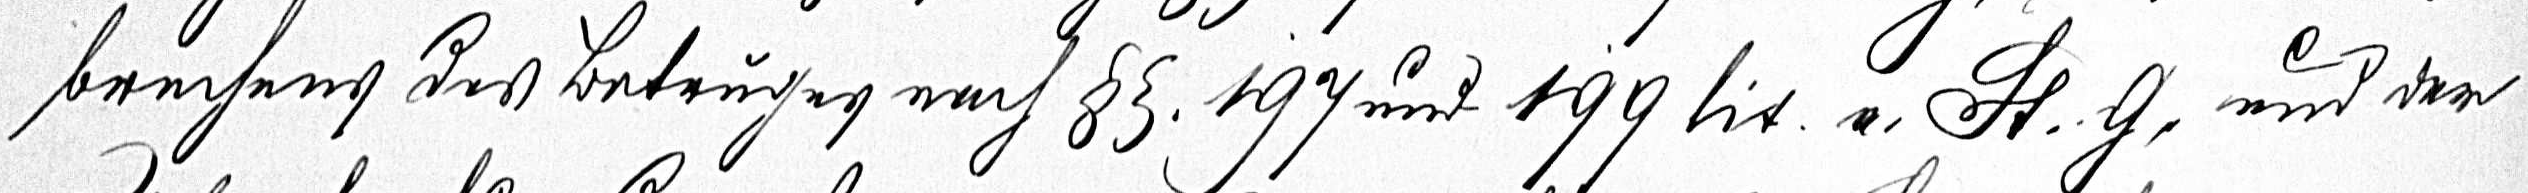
brechens des Betruges nach §§ 197 und 199 lit a St. G. und der
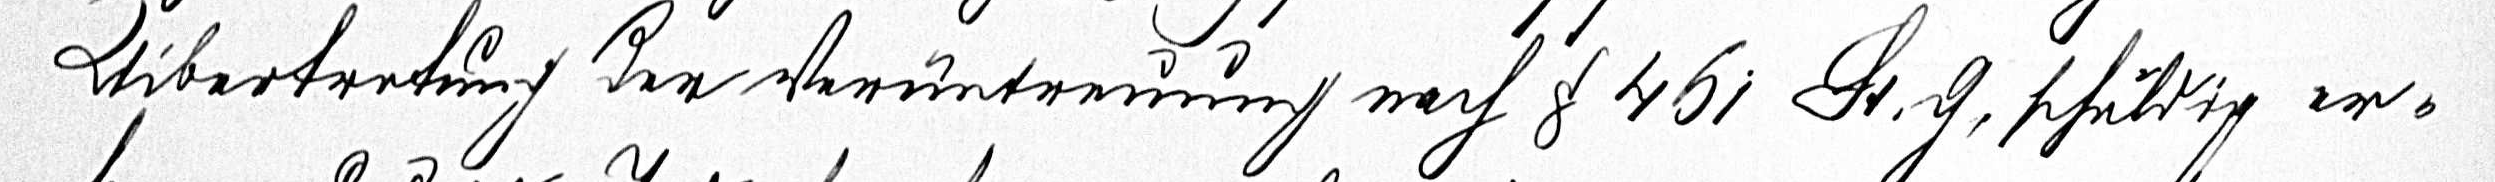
Uibertretung der Veruntreuung nach §451 St G schuldig er¬
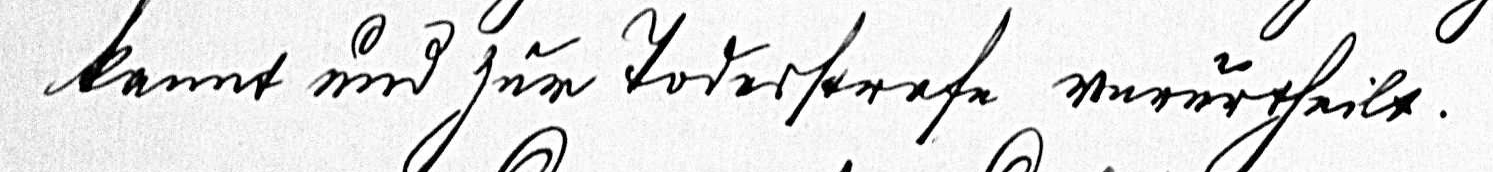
kannt und zur Todesstrafe verurtheilt.
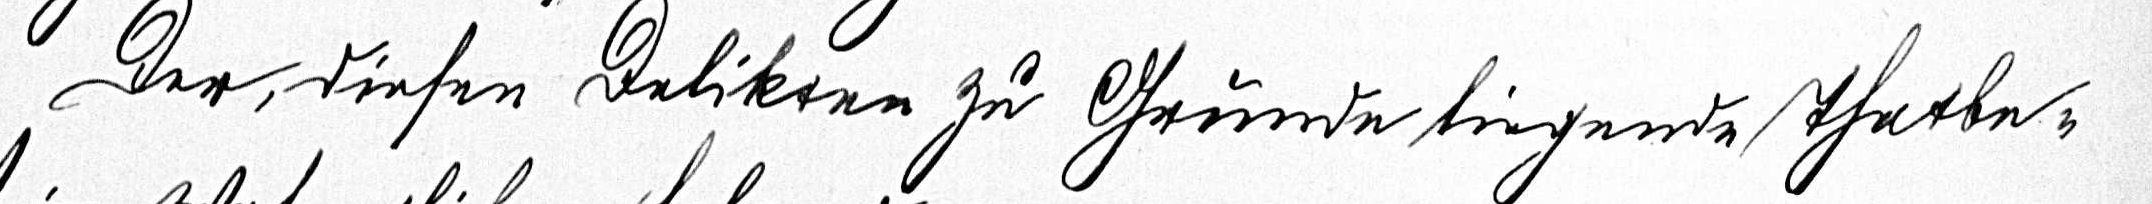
Der, diesen Delikten zu Grunde liegende Thatbe¬
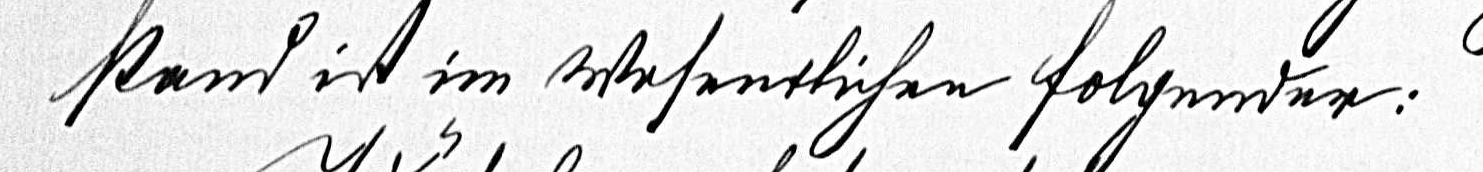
stand ist im wesentlichen folgender:
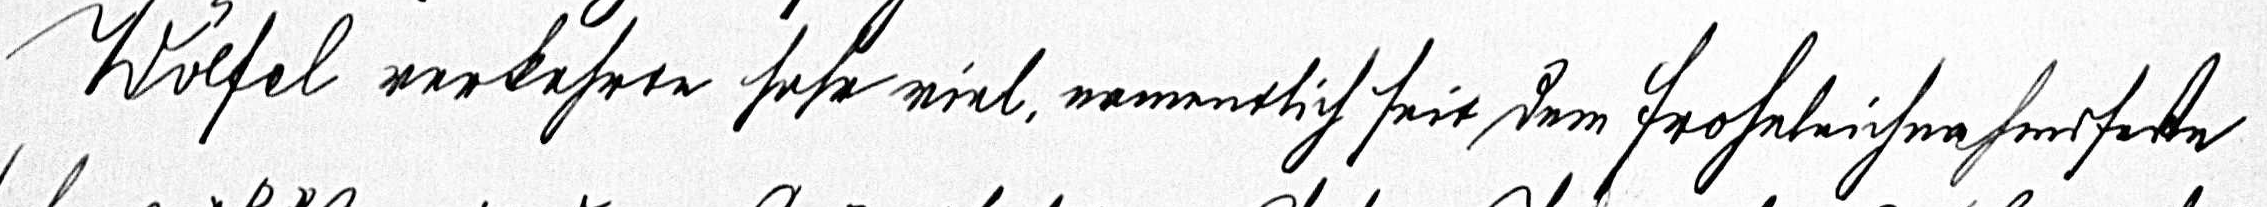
Wölfel verkehrte sehr viel, namentlich seit dem Frohnleichnahmsfeste
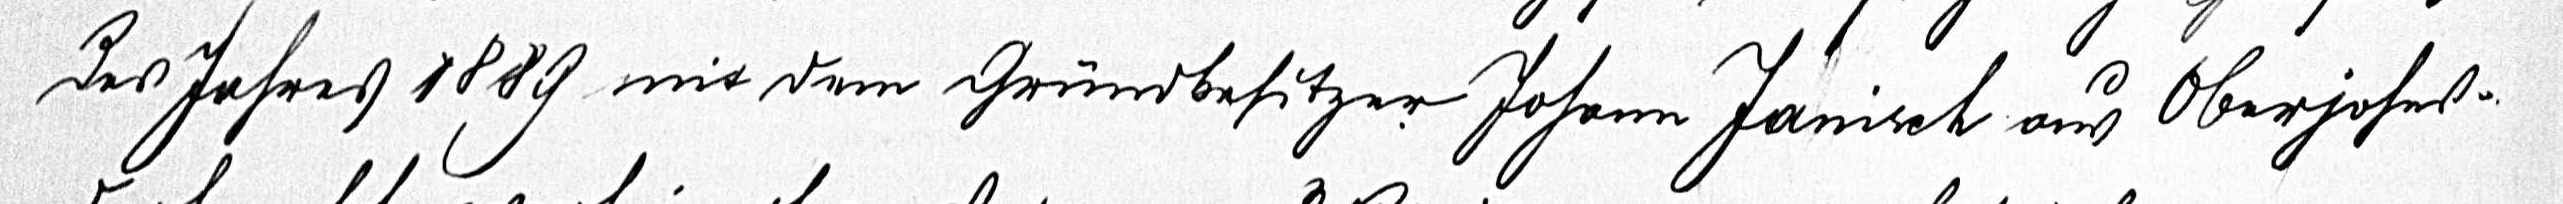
des Jahres 1889 mit dem Gründbesitzer Johann Janisch aus Oberjohns¬
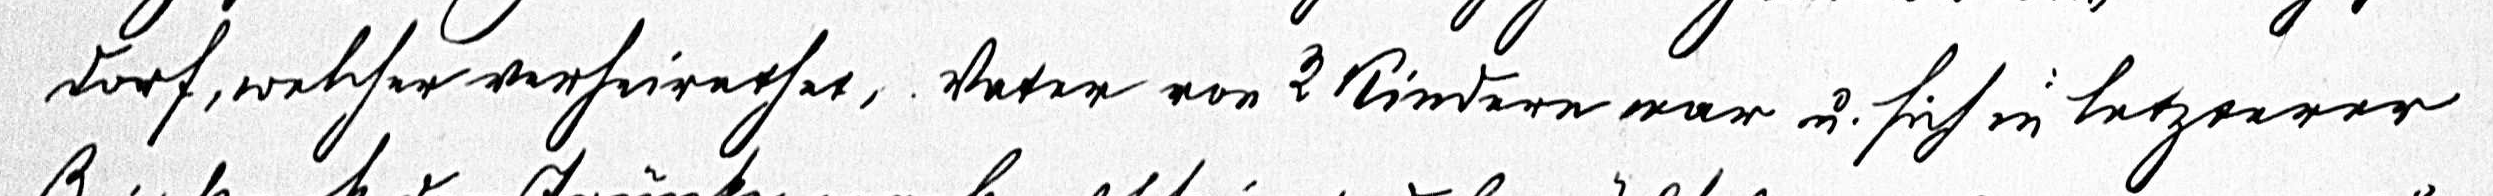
dorf, welcher verheirathet, Vater von 3 Kindern war u sich in letzterer
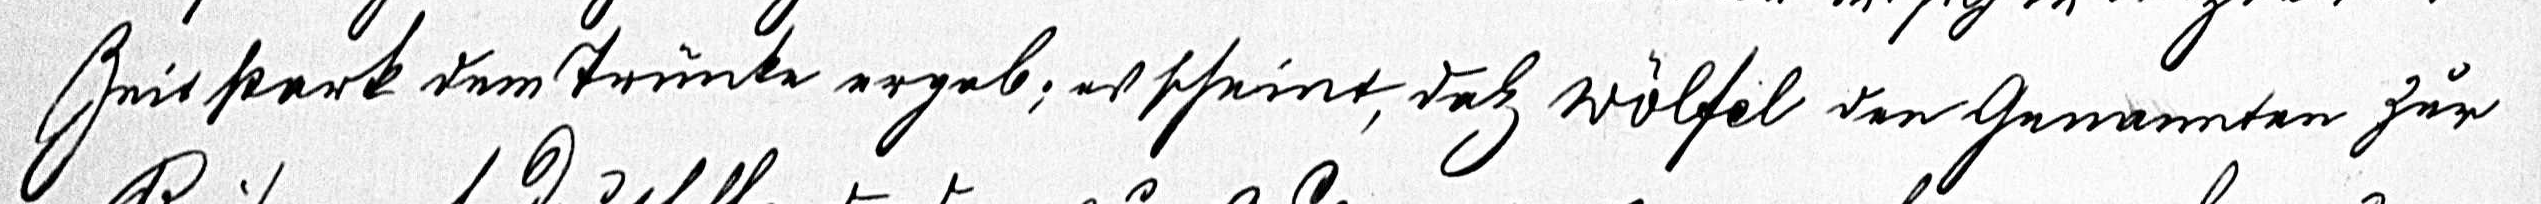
Zeit stark dem Trünke ergab; es scheint, daß Wölfel den Genannten zur
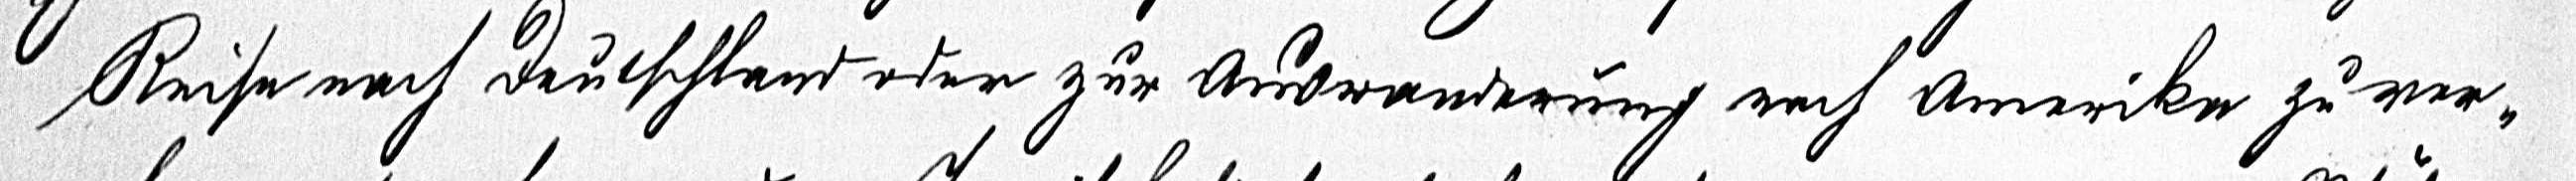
Reise nach Deutschland oder zur Auswanderung nach Amerika zu ver¬
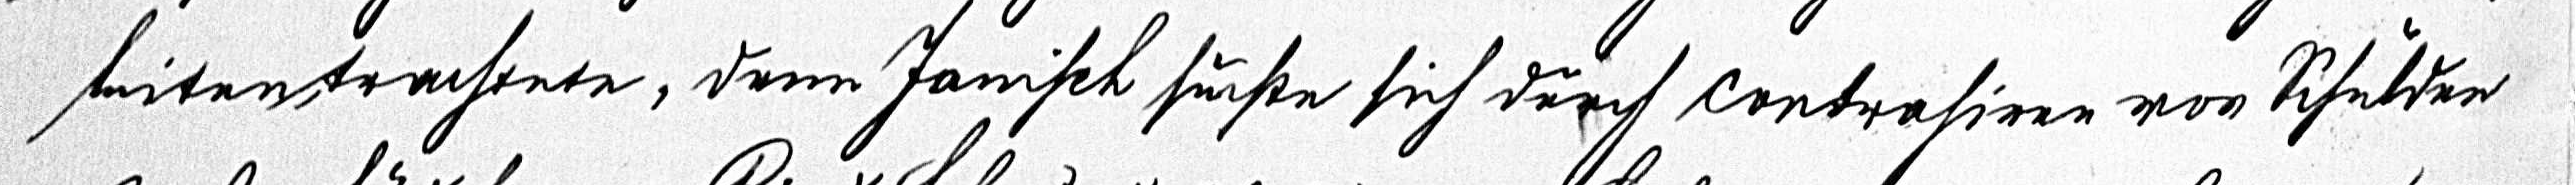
leiten trachtete, denn Janisch suchte sich durch Contrahiren von Schulden
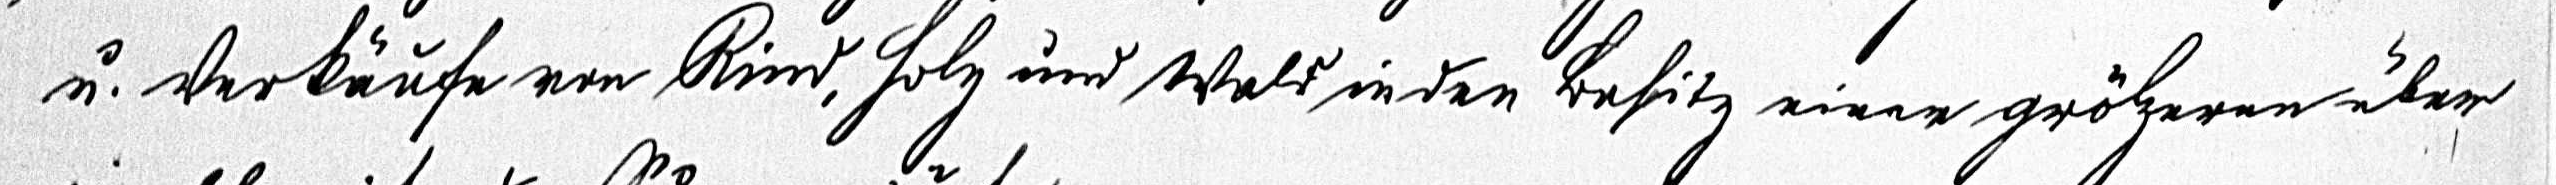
u. Verkäufe von Rind, Holz und Wald in den Besitz einer größeren über
